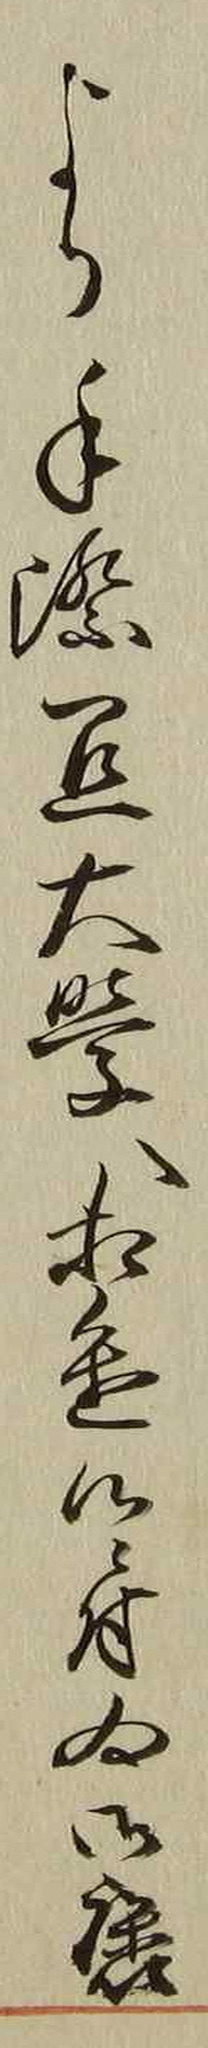より手際宜大学へ相進侯ニ付為御褒
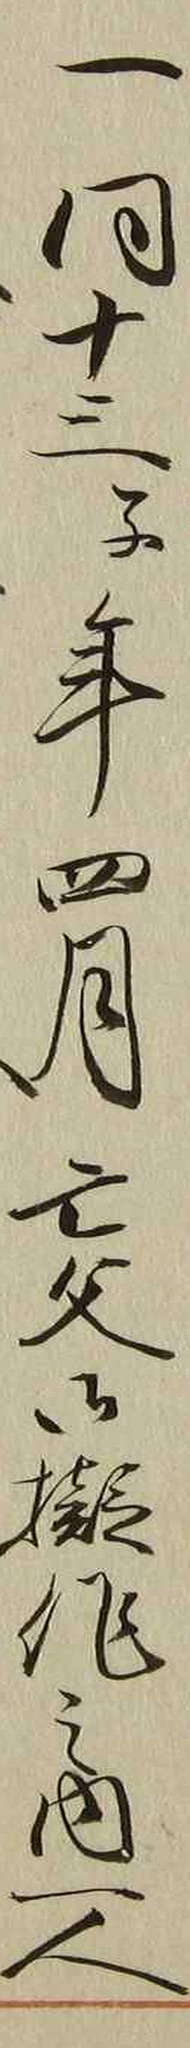一同十三子年四月亡父御擬作之内一人
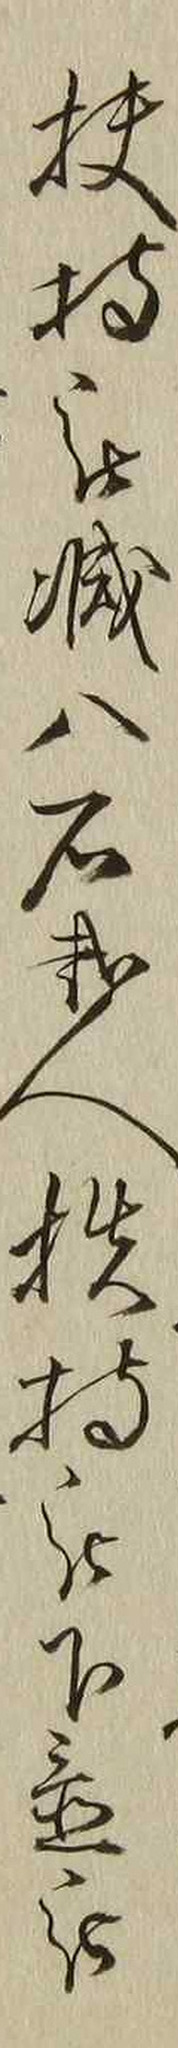扶持被減八石弐人扶持被下置被
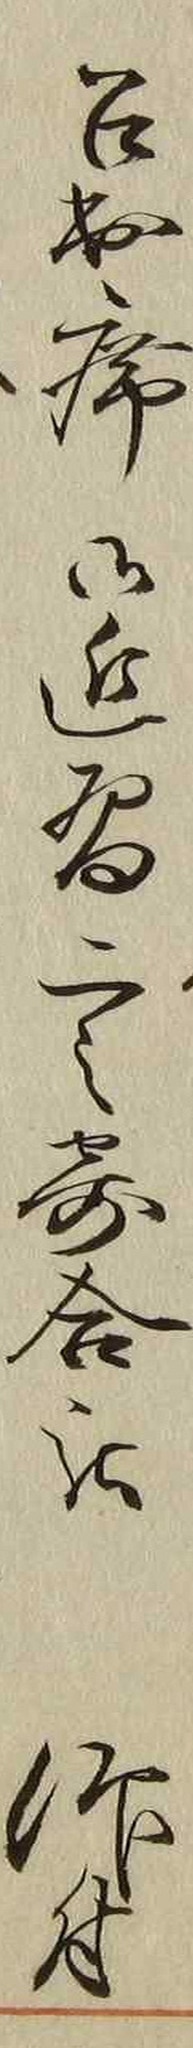召出席御近習二之寄合被仰付
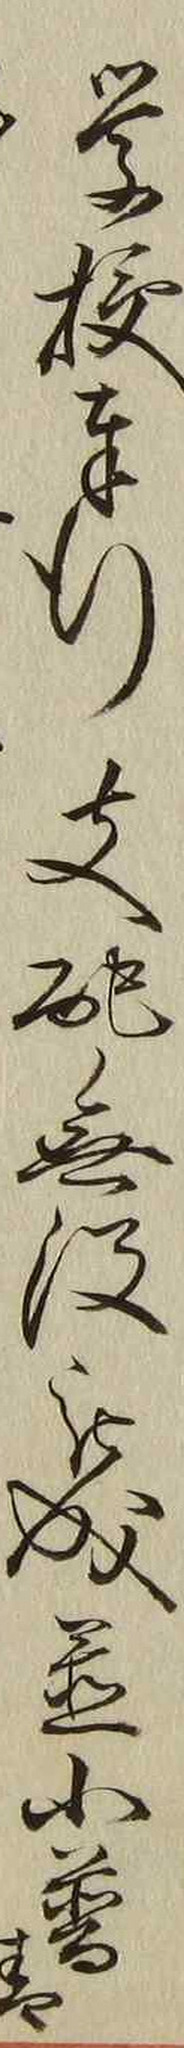学校奉行支配無役被成置小普請
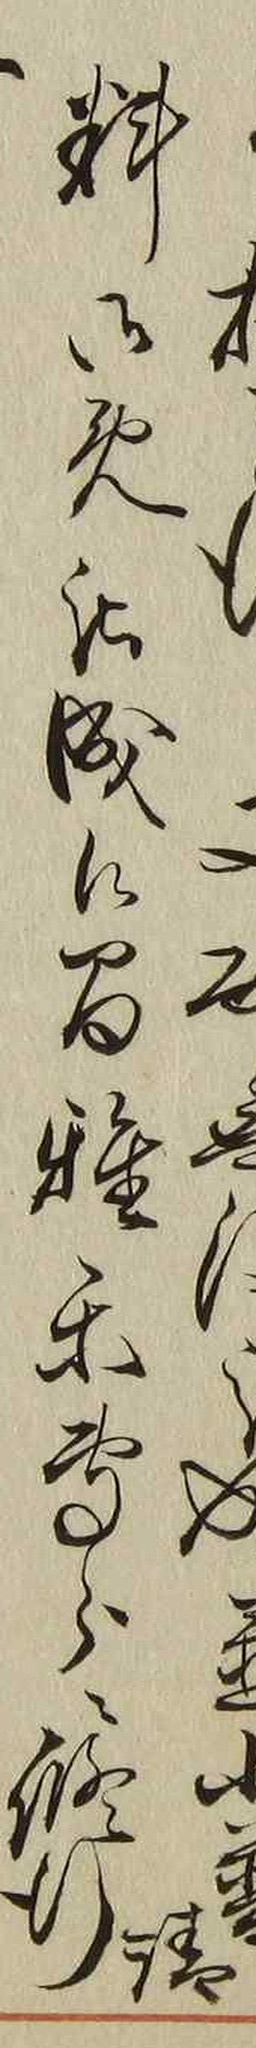料御免被成候間雅楽専らニ修行
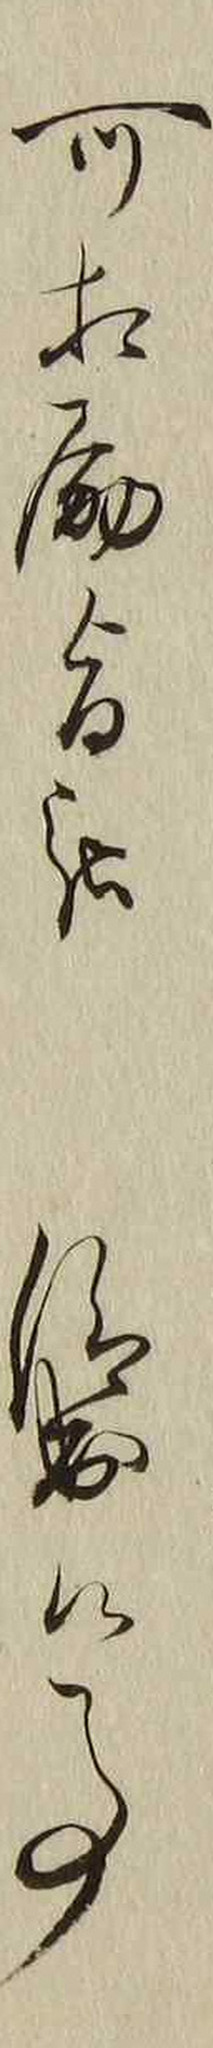可相励旨被仰出候事
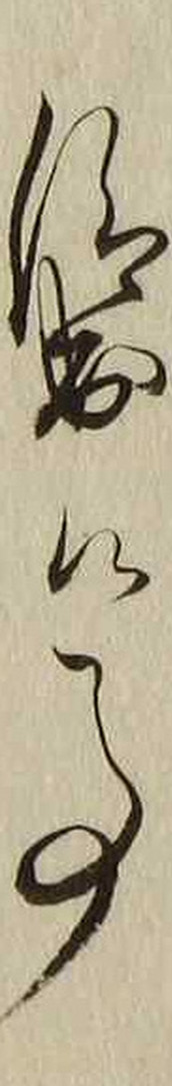仰付候事
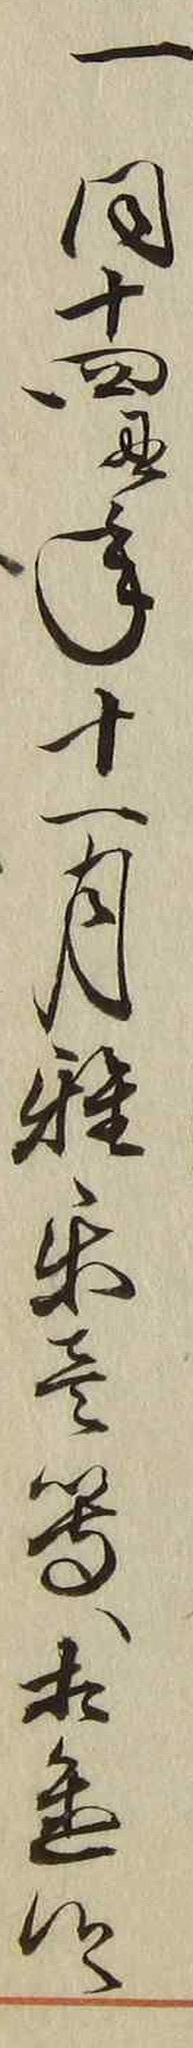一同十四丑年十一月雅楽壱等へ相進候ニ
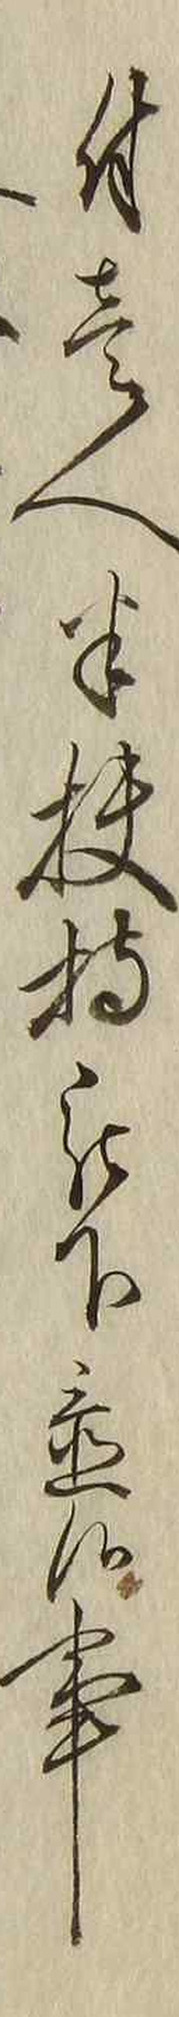付壱人半扶持被下置候事
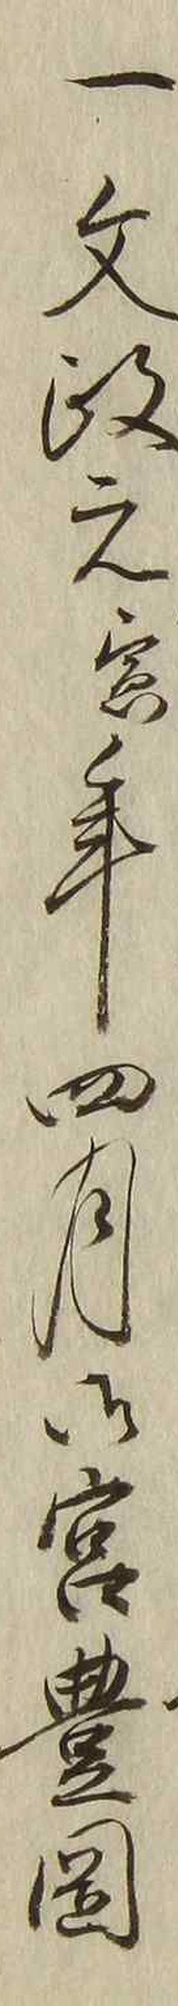一文政元寅年四月御宮豊岡

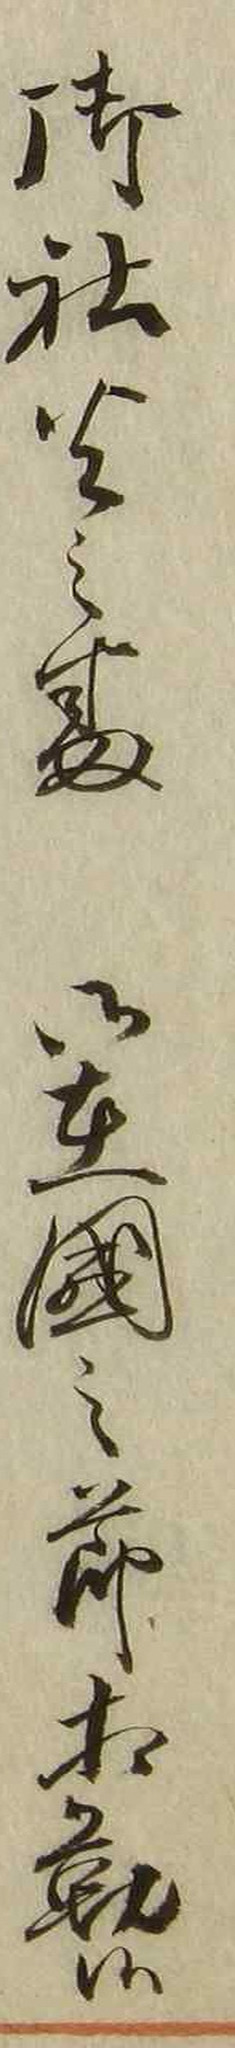御社火之番御在国之節相勤候
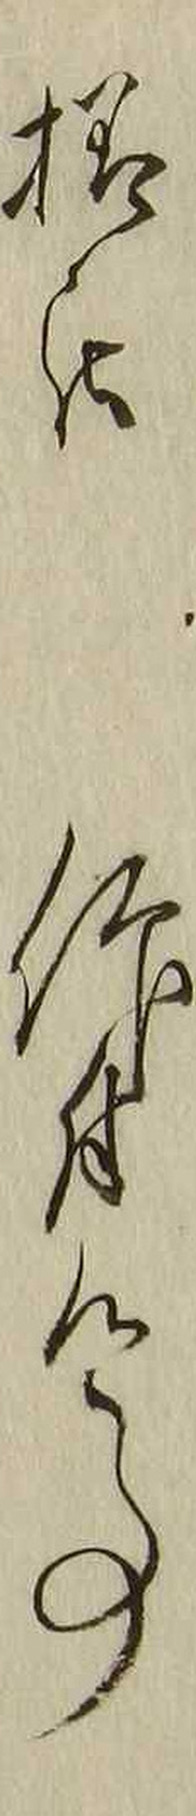様被仰付候事
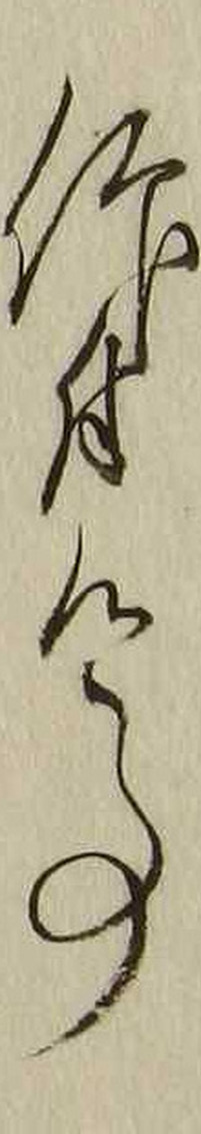仰付候事
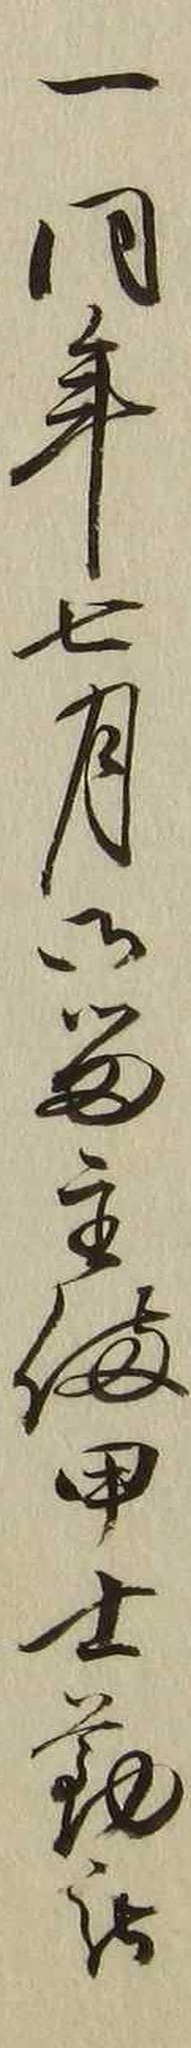一同年七月御留主備甲士勤被
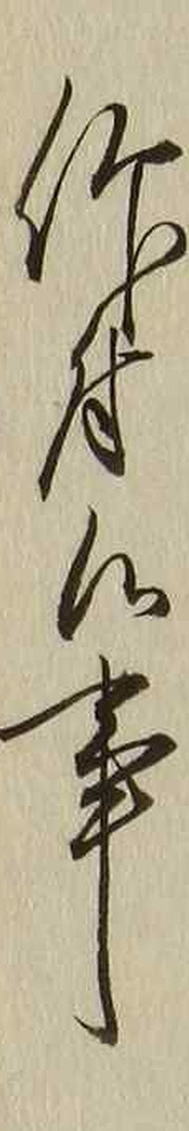仰付候事
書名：諸士系譜　巻之57　ほ之部4
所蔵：会津若松市立会津図書館
